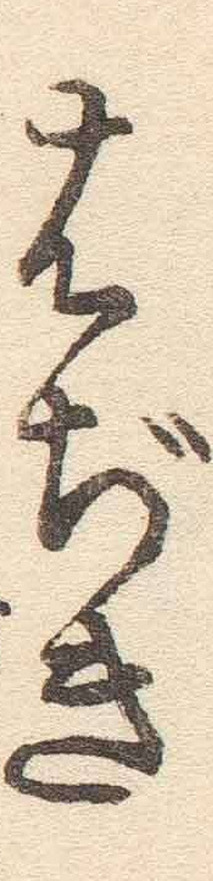はぢき
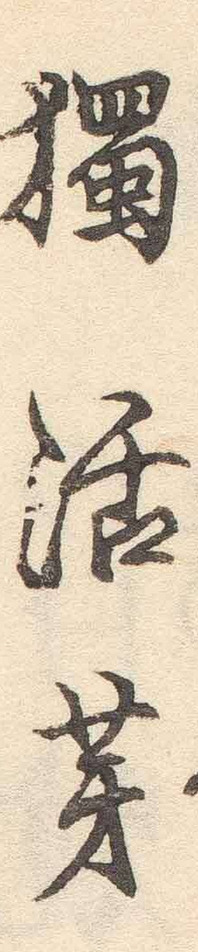独活芽
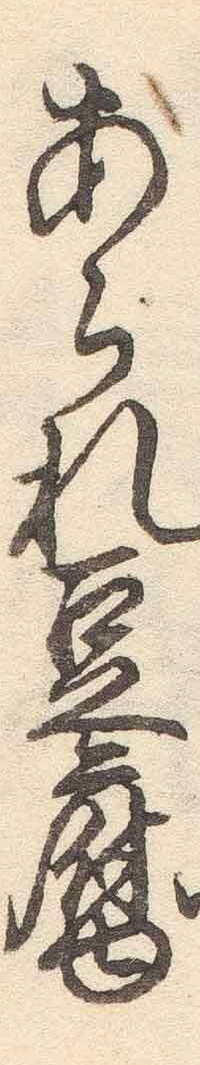あられ豆腐
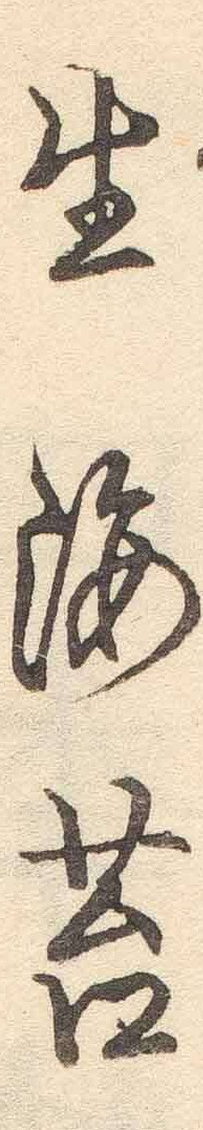生海苔
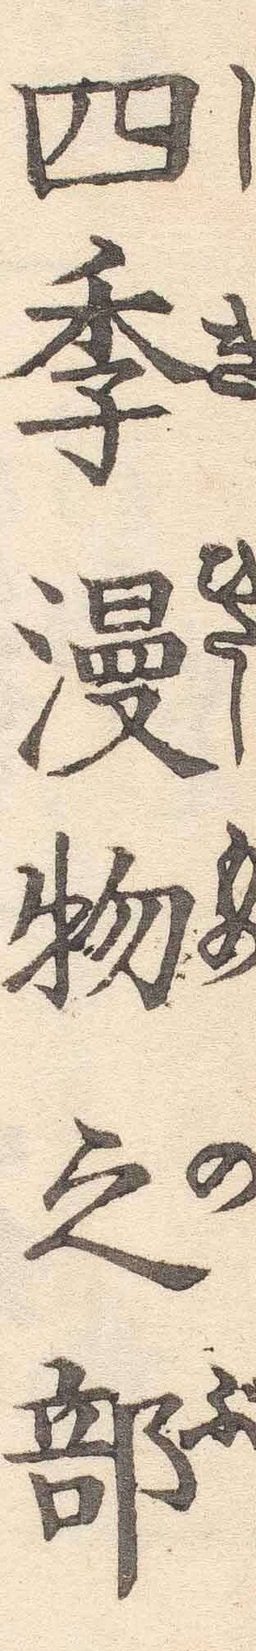四季漫物之部
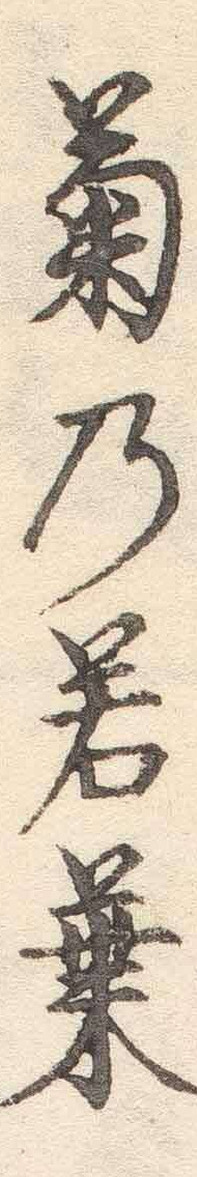菊の若葉
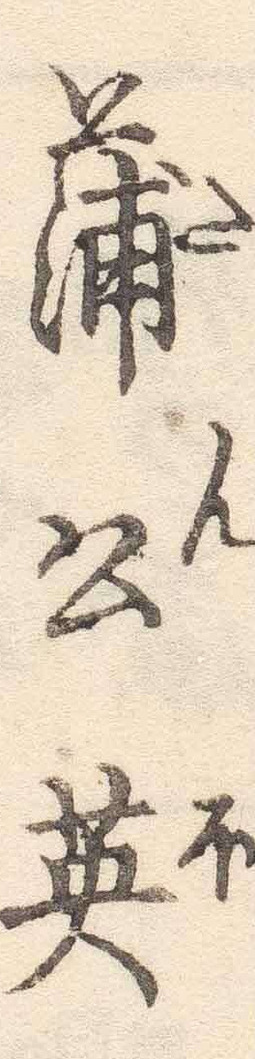蒲公英
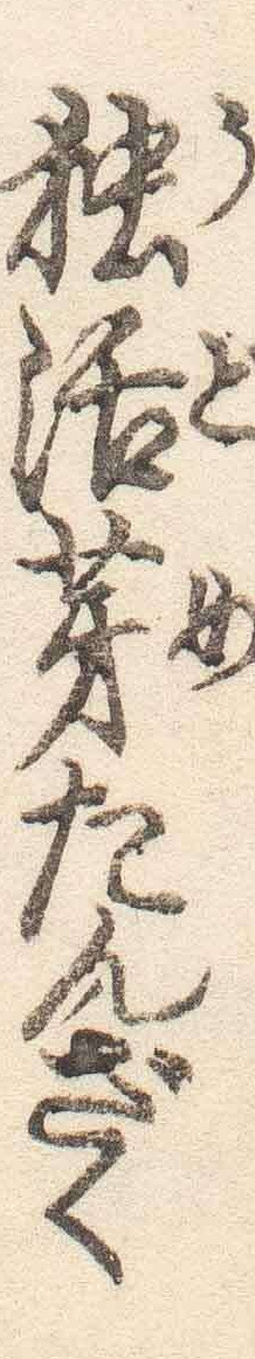独活芽たんざく
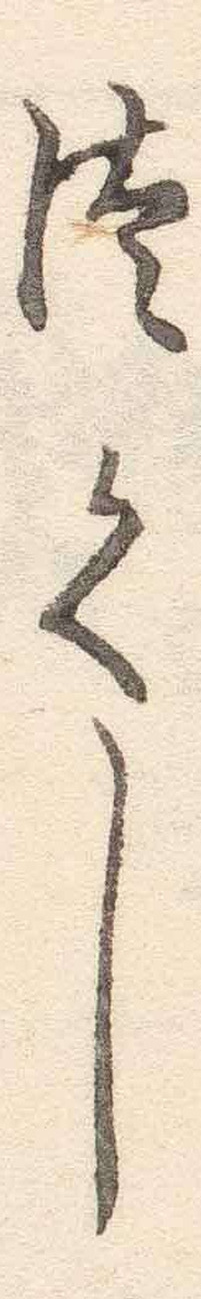つくし
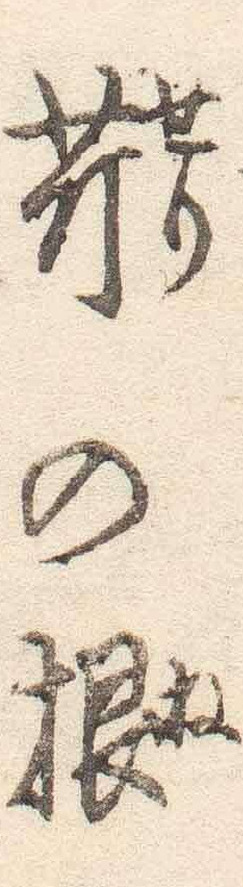芹の根
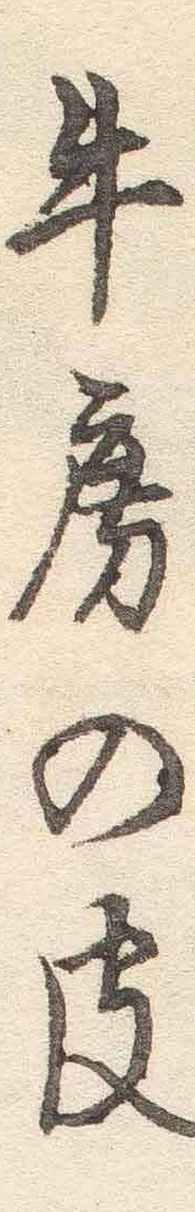牛蒡の皮
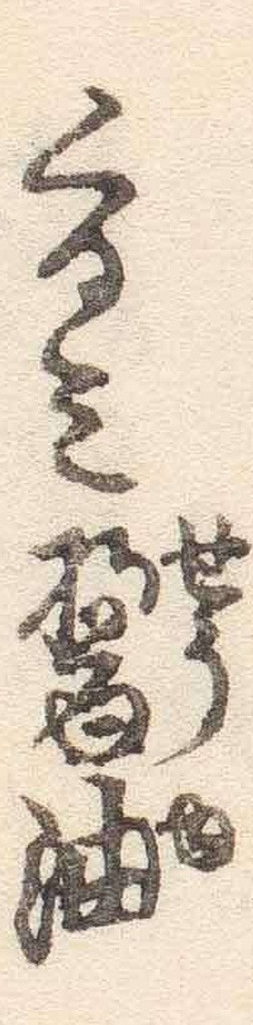くるみ醤油
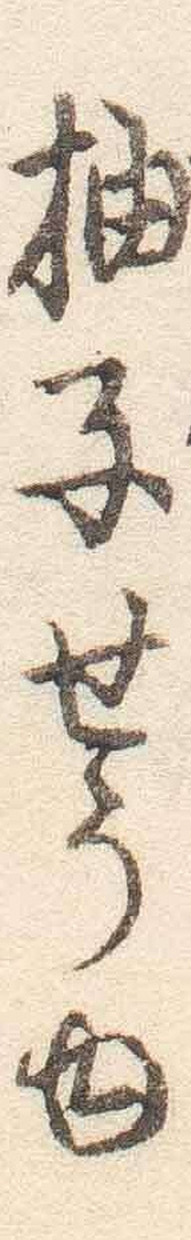柚子せうゆ
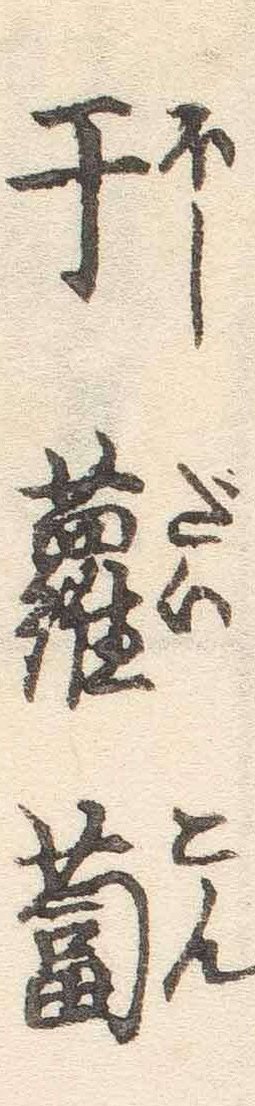干蘿蔔
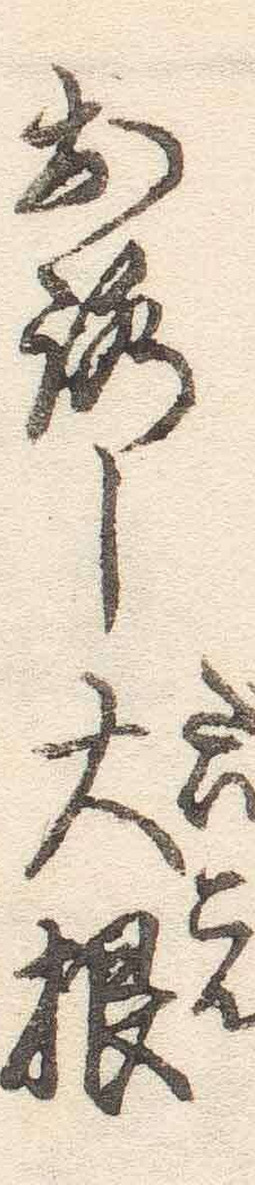おろし大根
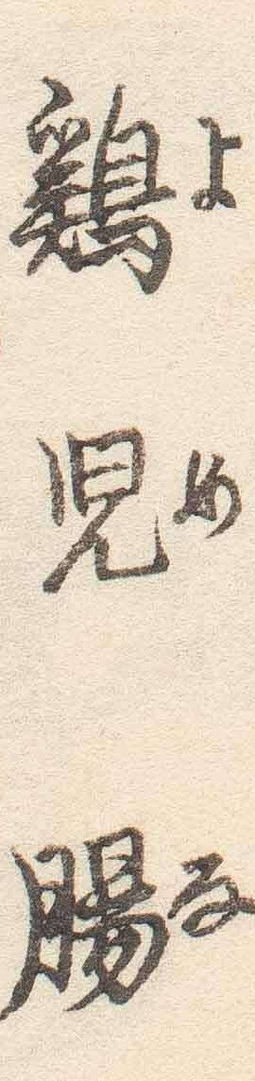鶏児腸
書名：料理通
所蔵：東京学芸大学附属図書館 国文学研究資料館
